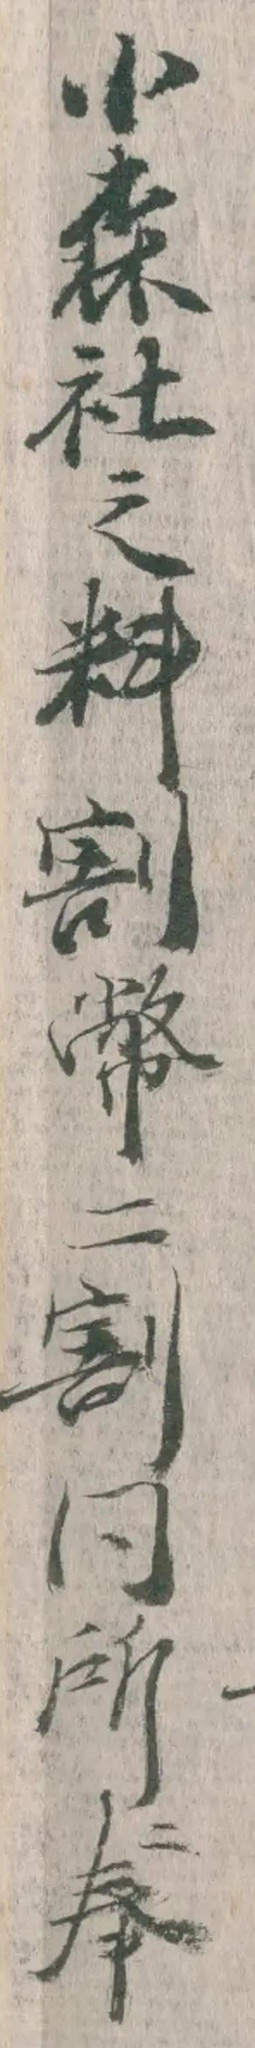小森社之料割幣二割同所ニ奉
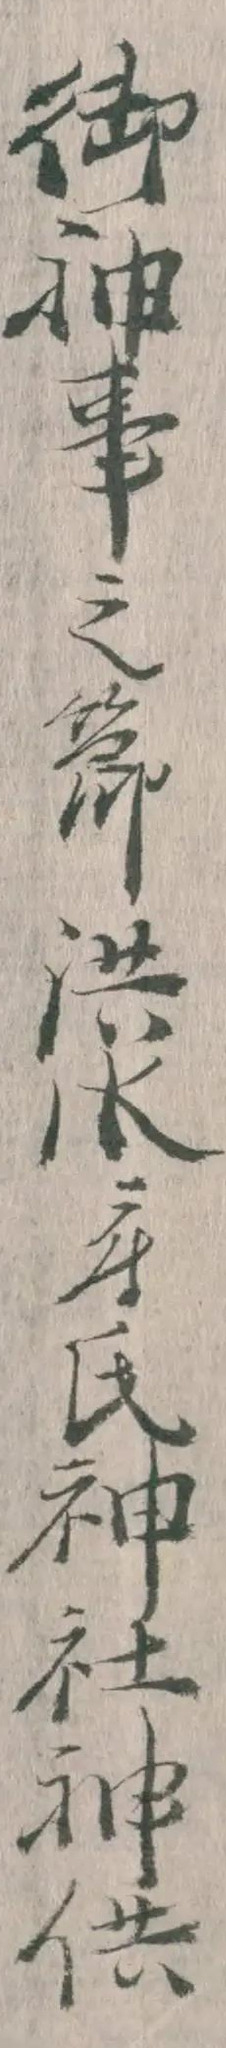一御神事之節洪水ニ付氏神社神供
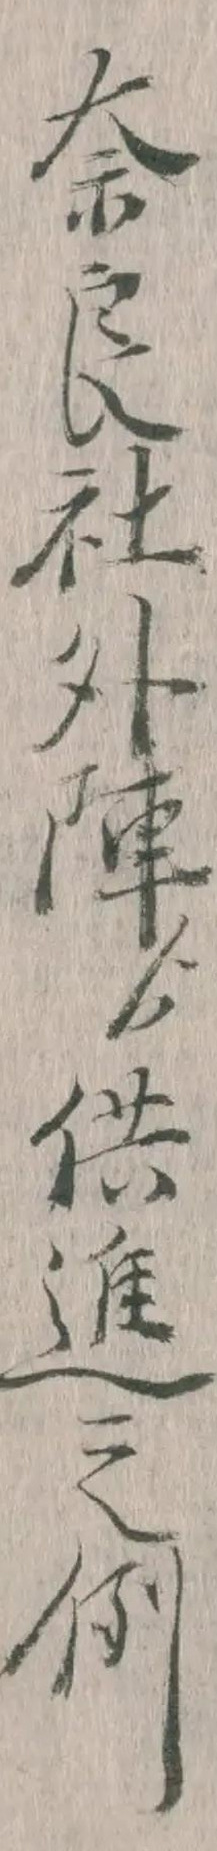奈良社外陣ゟ供進之例
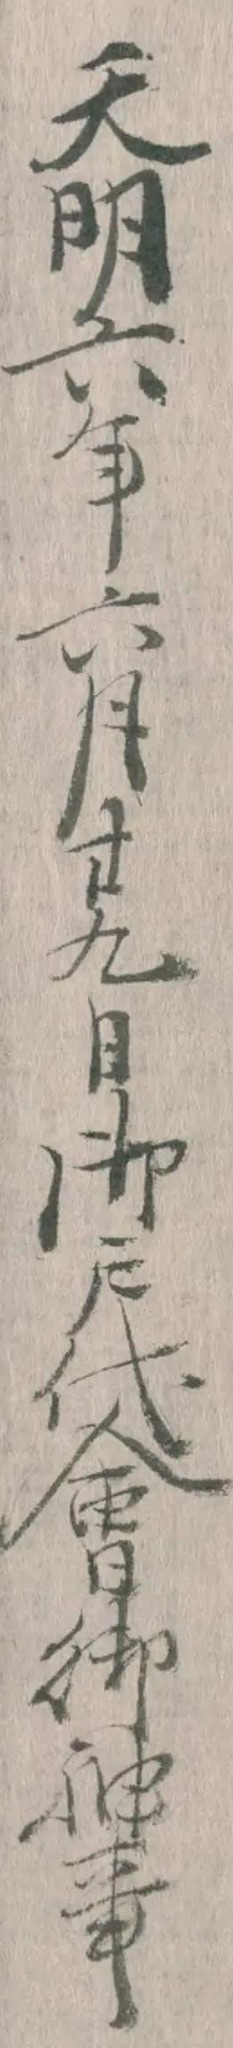天明六年六月廿九日御戸代會御神事
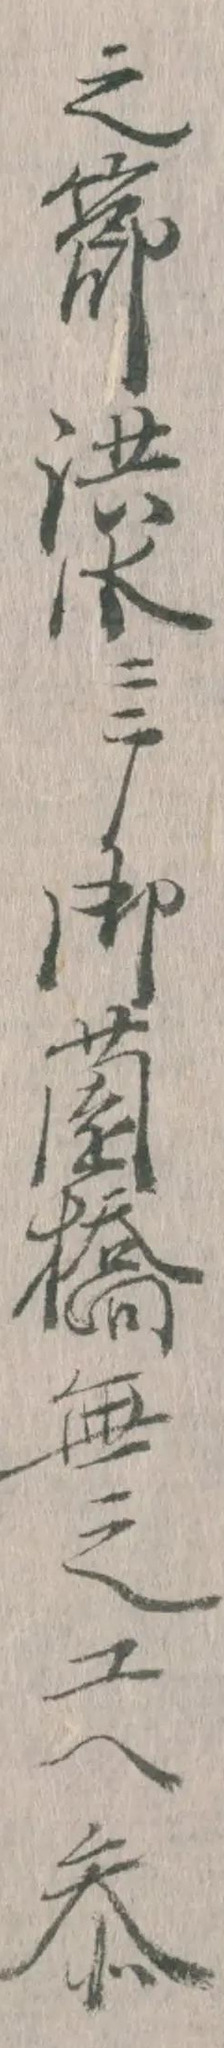之節洪水ニテ御薗橋無之ユヘ参
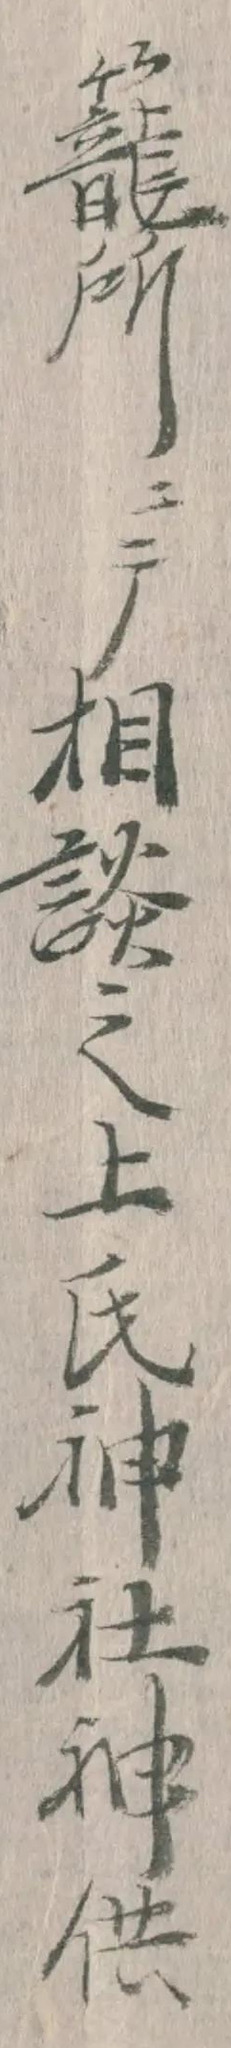龍所ニテ相談之上氏神社神供
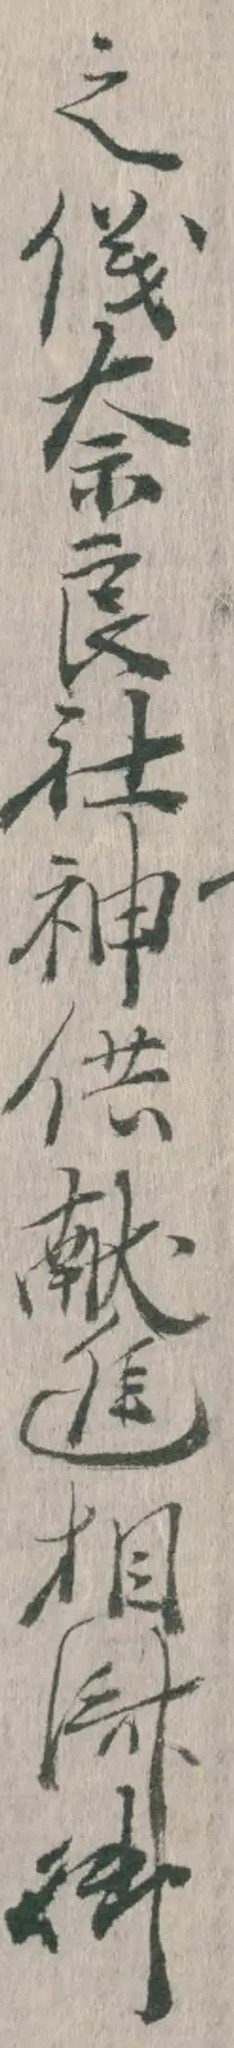之儀奈良社神供献進相済御
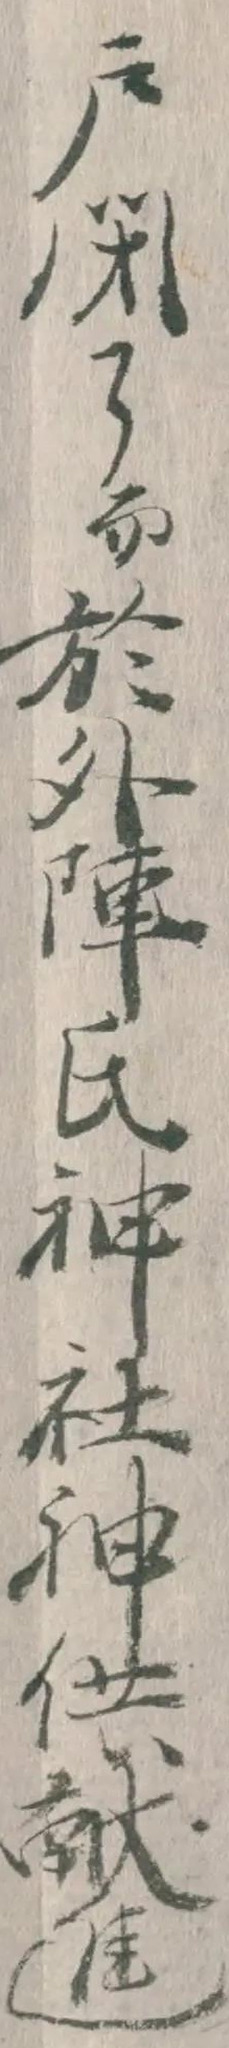戸閉了而於外陣氏神社神供献進
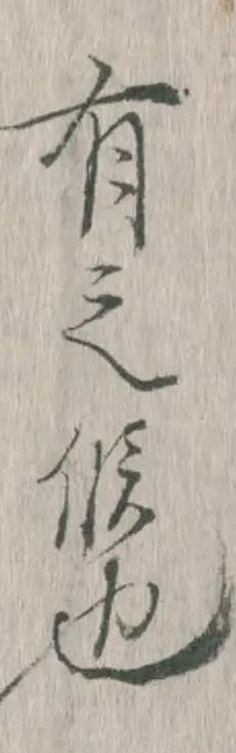有之候也
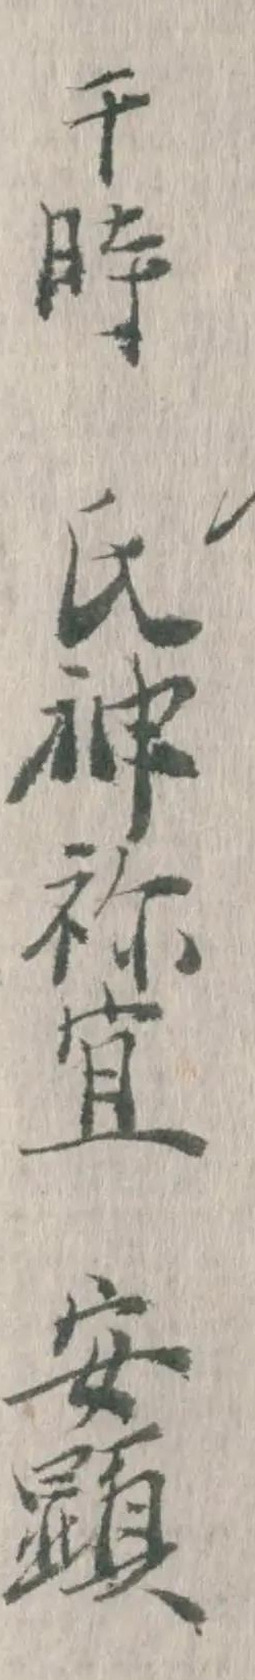于時氏神祢宜安顕
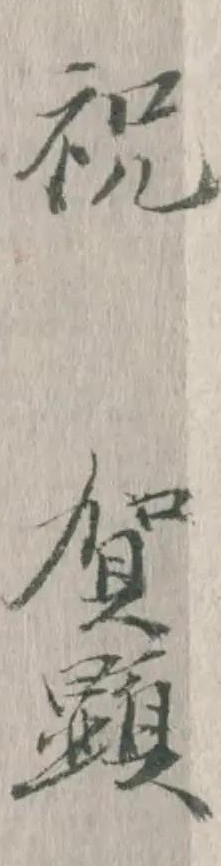祝賀顕
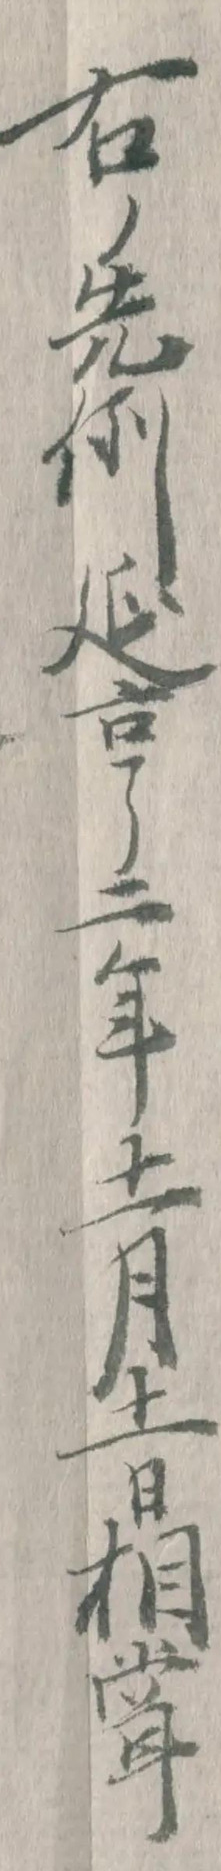右ノ先例延享二年十一月十一日相嘗
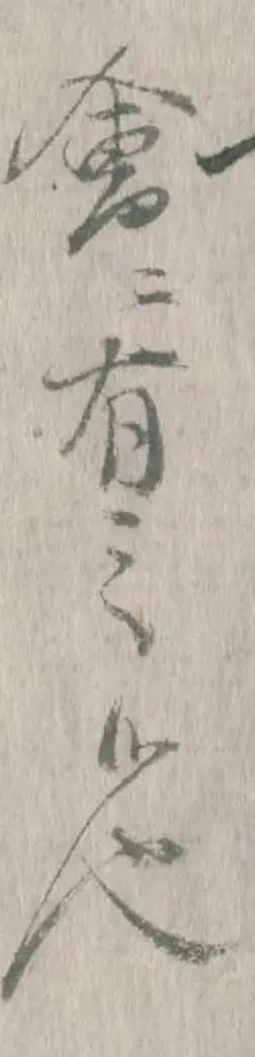會ニ有之候也

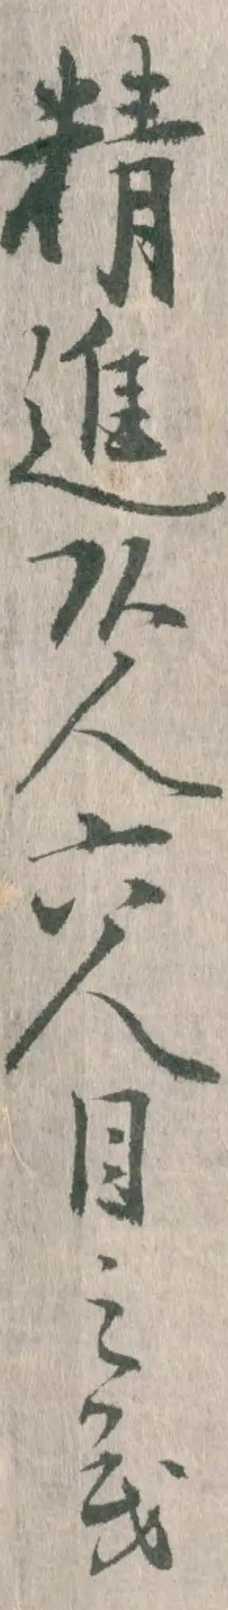精進頭人六人目之義
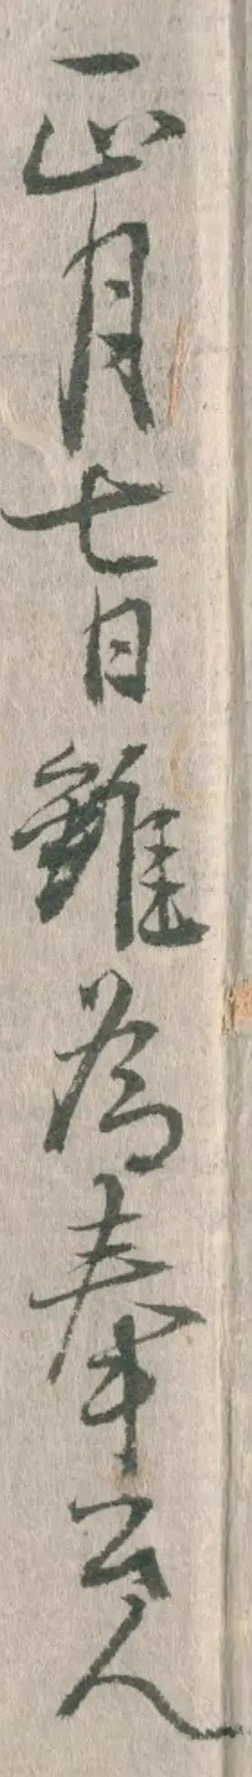正月七日雖為奉公人
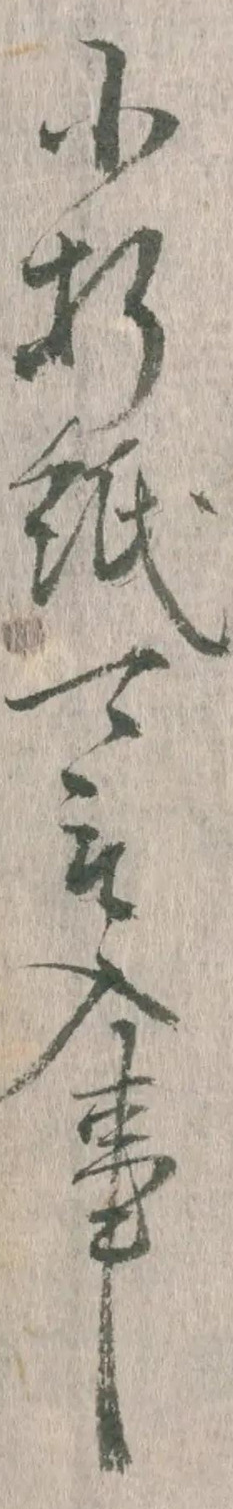小折紙可被入事
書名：賀茂社記録. 第72冊
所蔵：国立国会図書館 National Diet Library, JAPAN
